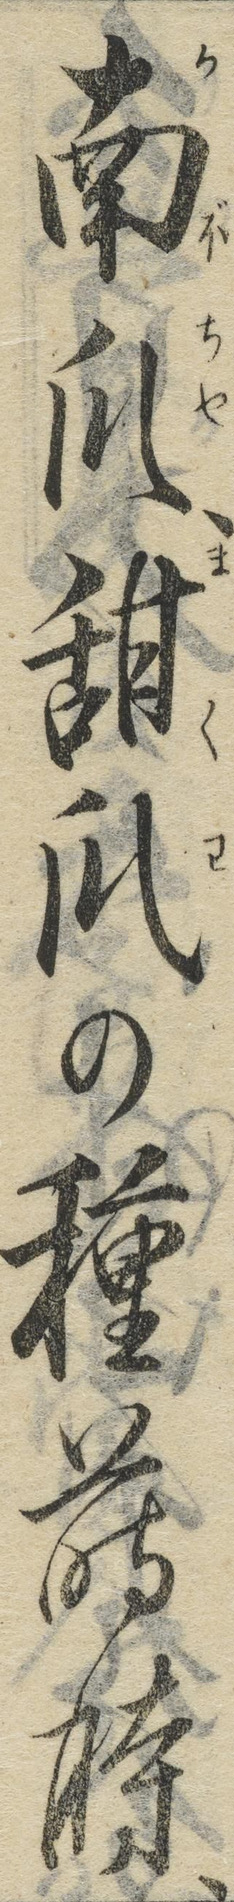南瓜、甜瓜の種蒔時、
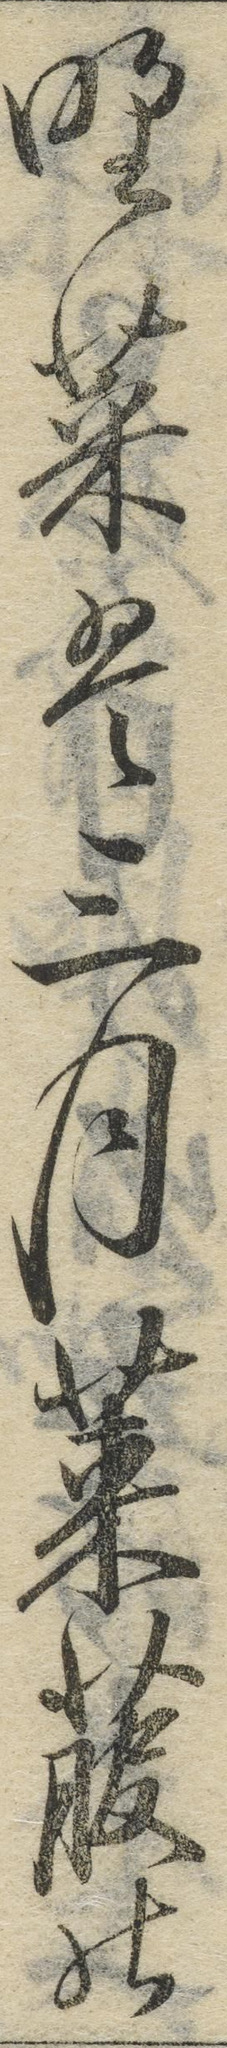野菜は三月菜菔の
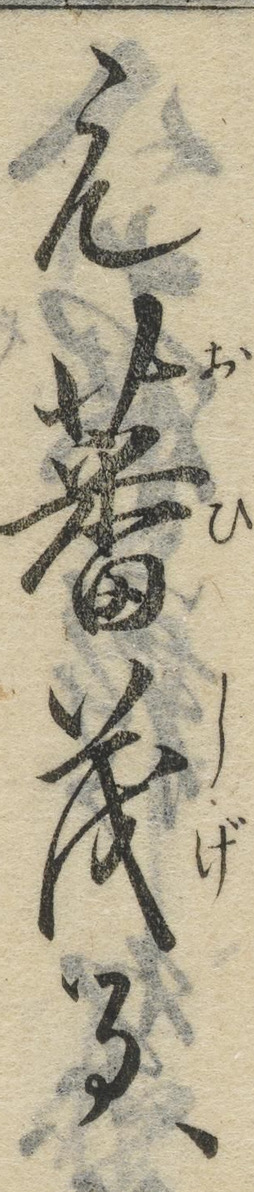も蕃茂る、
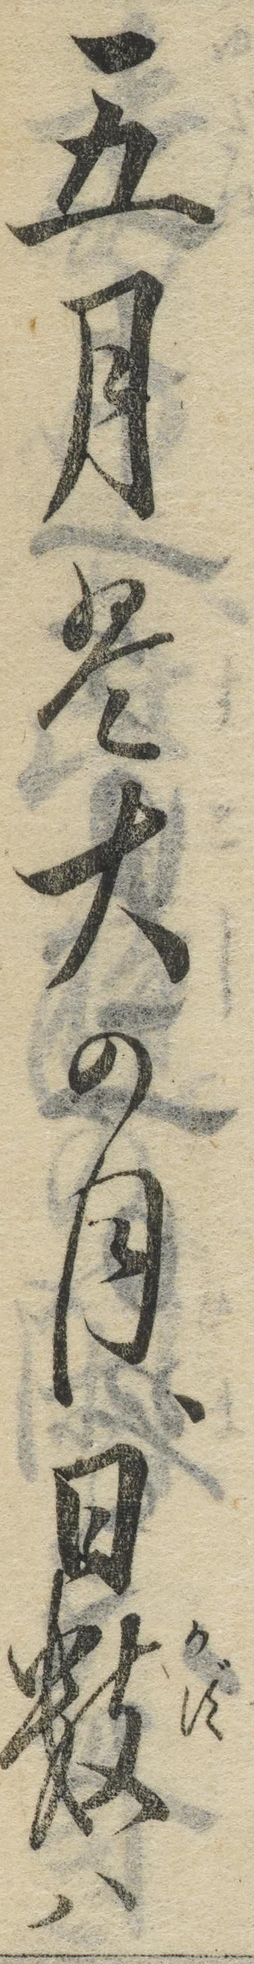五月は大の月、日数は

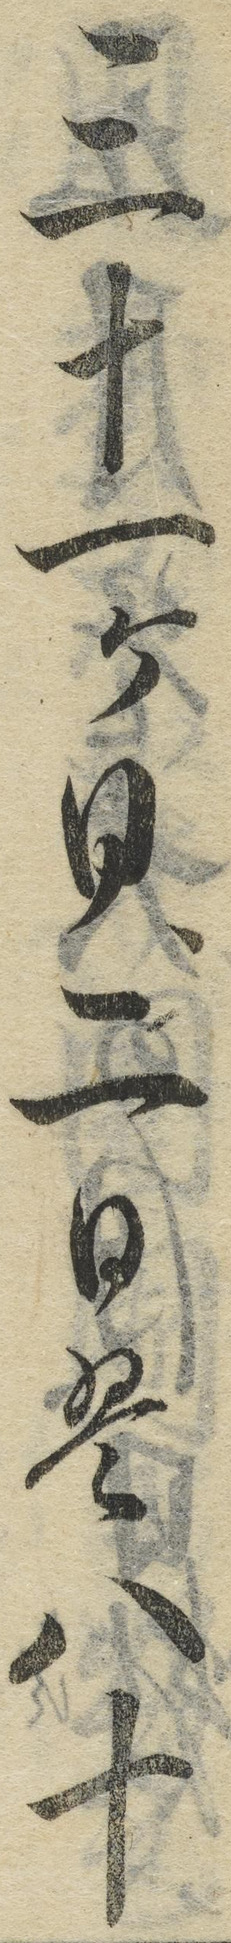三十一ヶ日、二日は八十
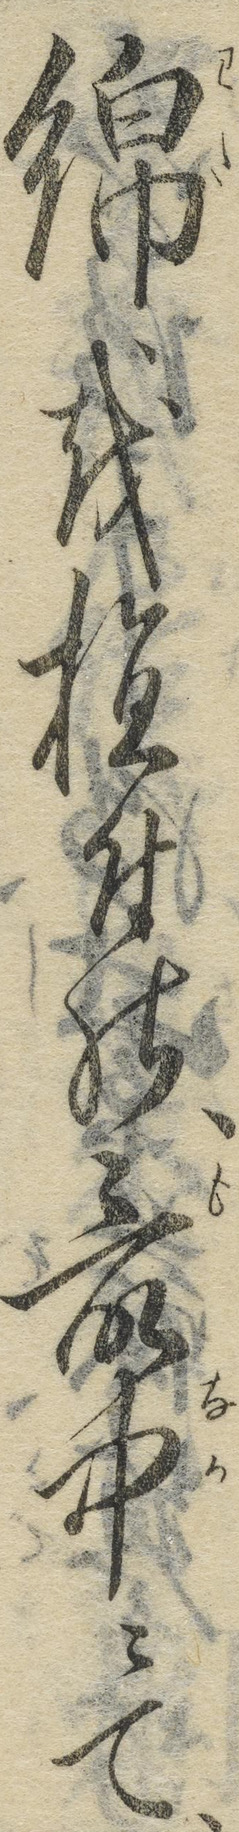綿を植付の、最中にて、
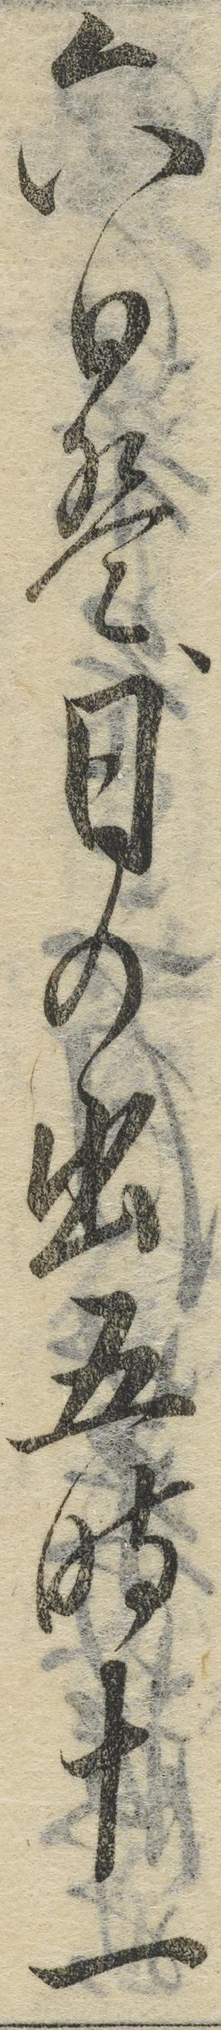六日は、日の出五時十一
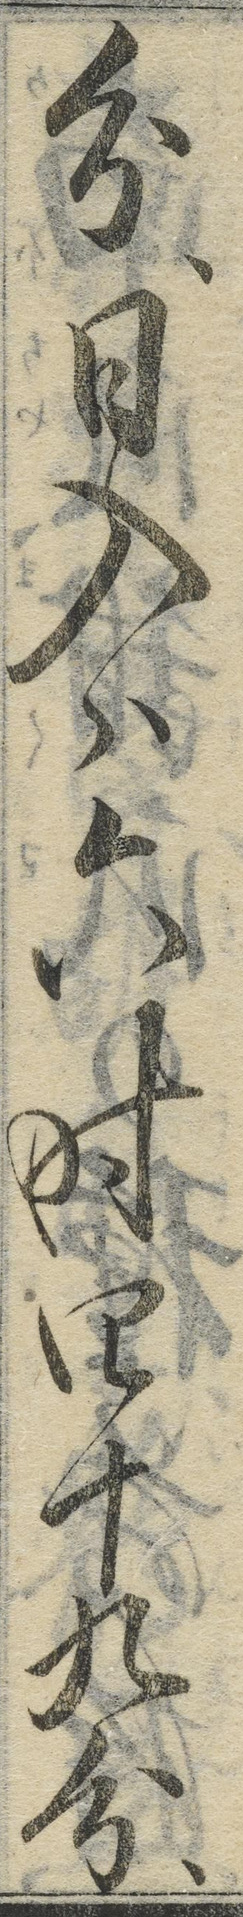分、日入は六時四十九分、
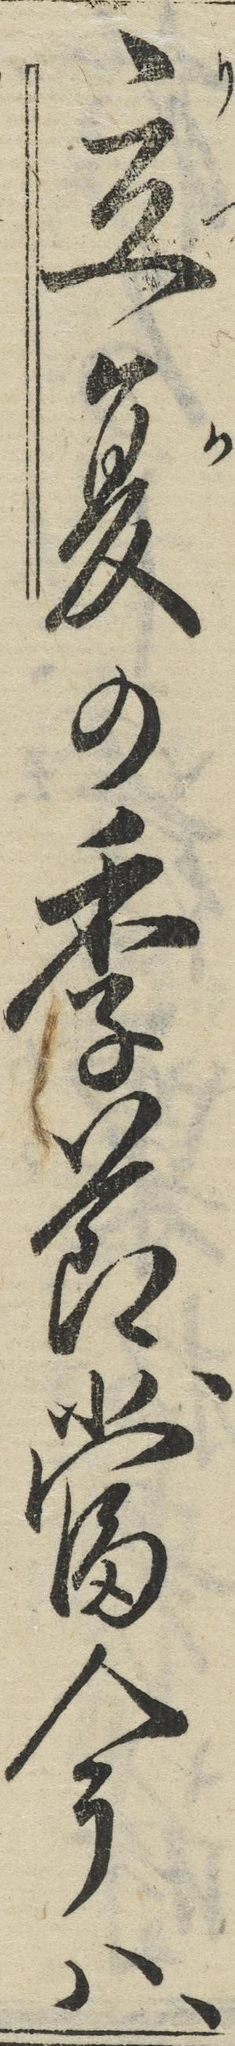立夏の季節、当今は、
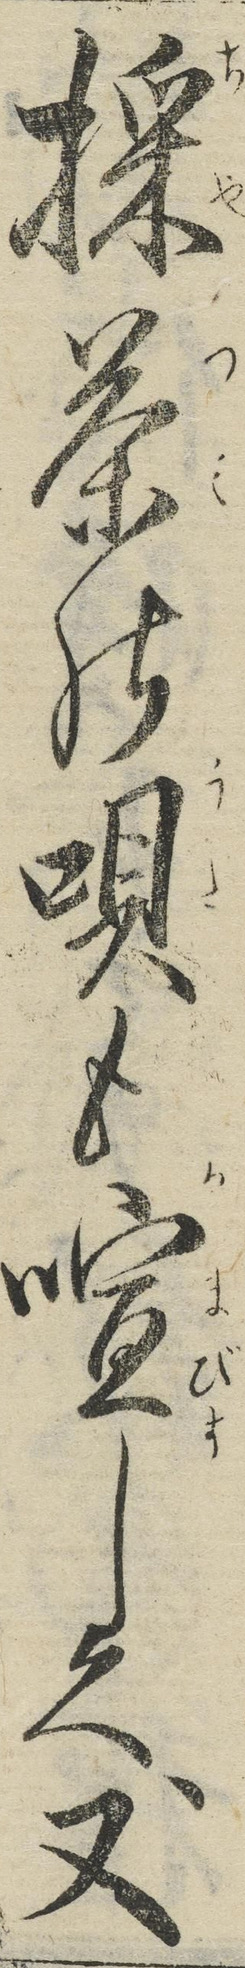採茶の唄も喧しく、又
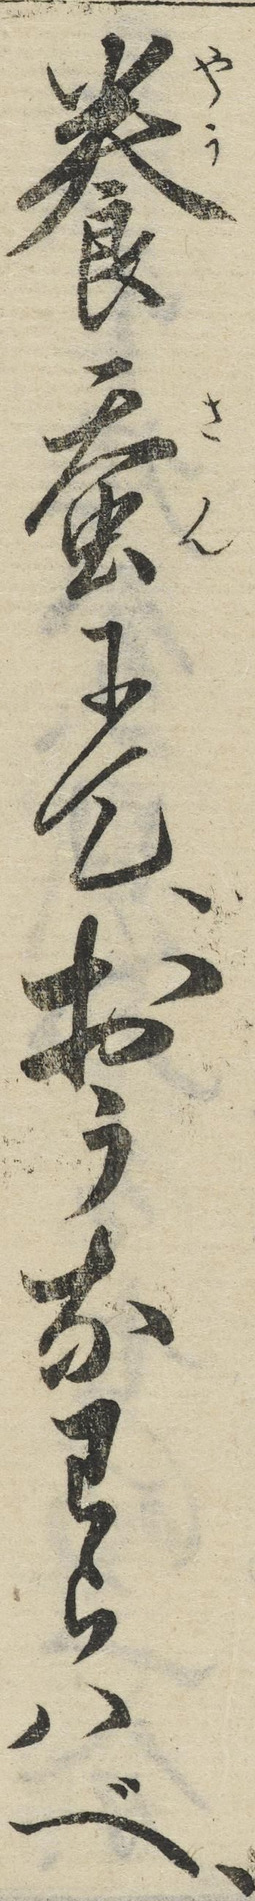養蚕にて、おうなわらはべ、
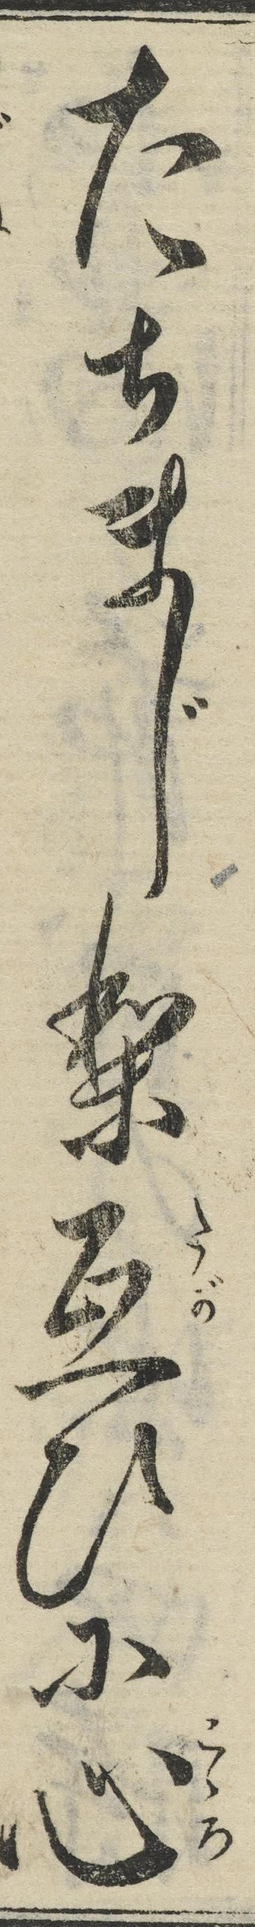たちまじり互ひに心
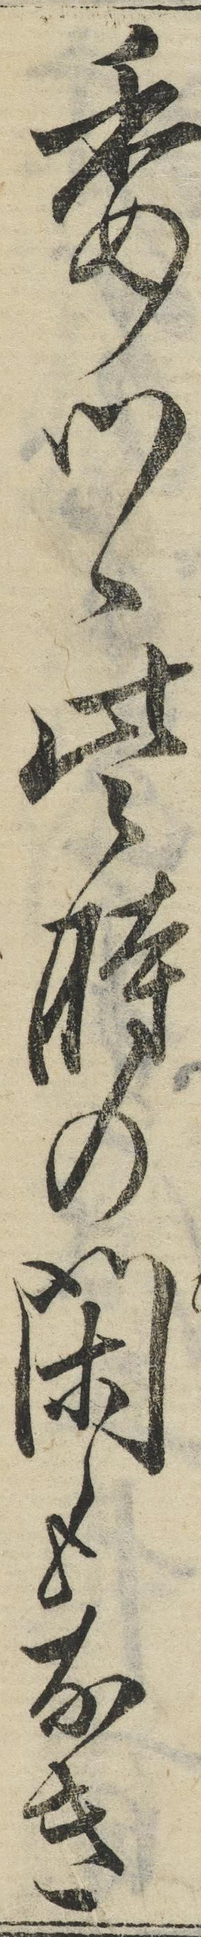委つゝ、些時の閑もなき

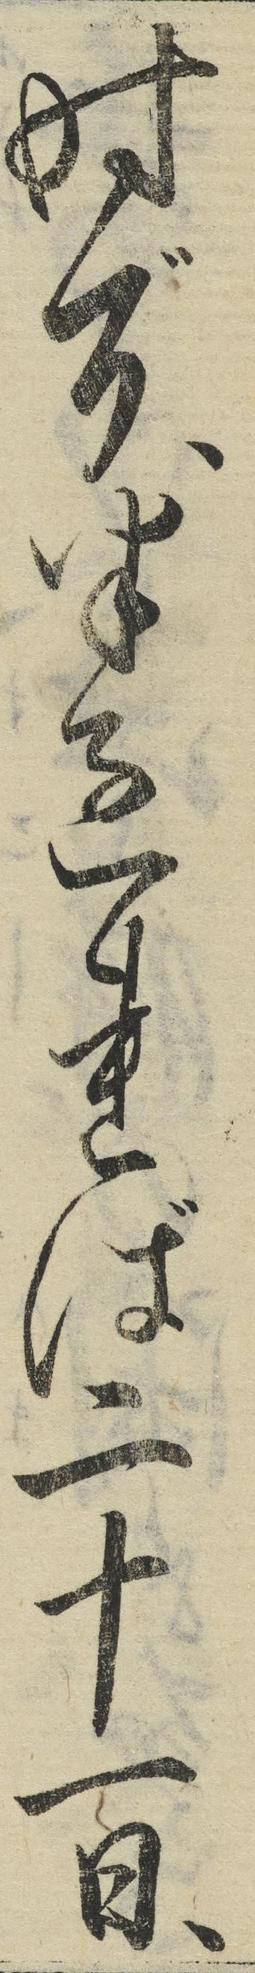時ぞ、半過れば二十一日、
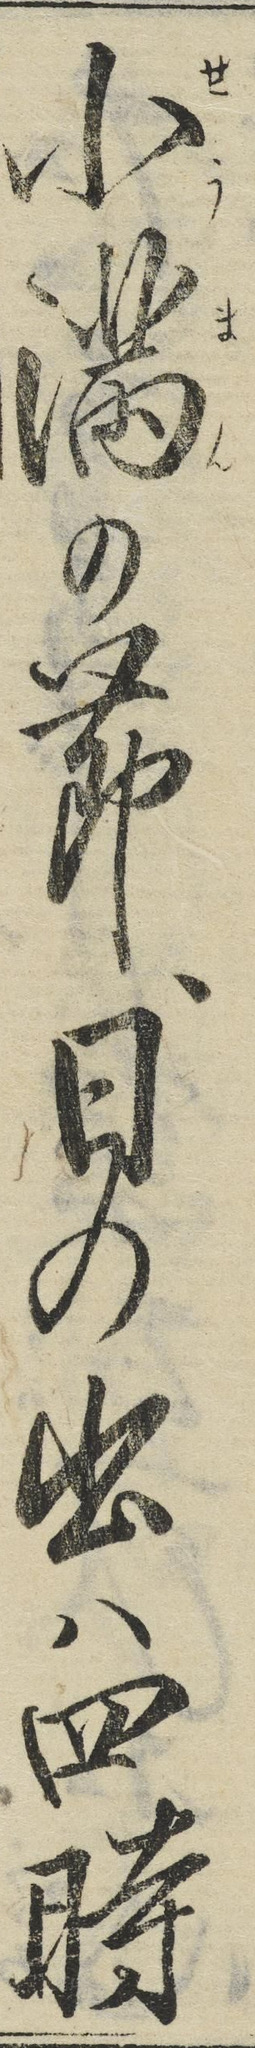小満の節、日の出は四時
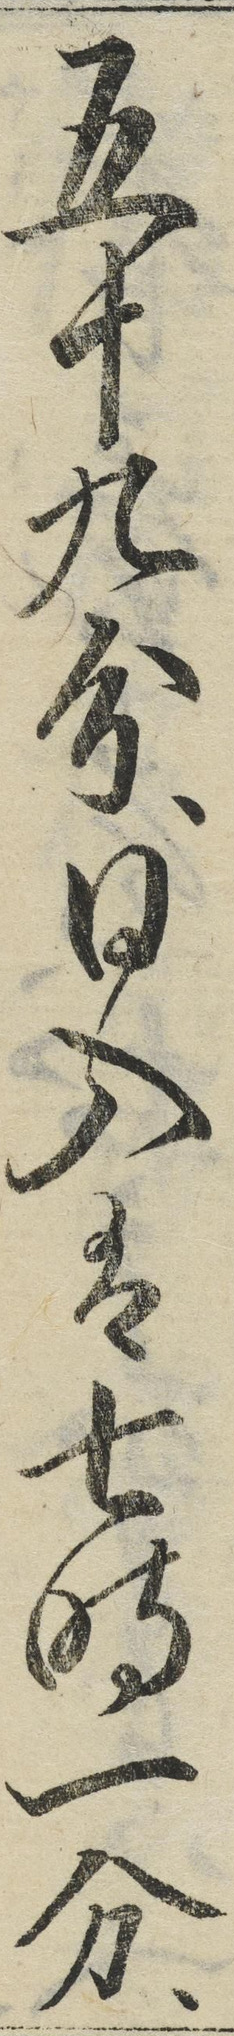五十九分、日入は七時一分、
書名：暦日往来　單
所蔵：東京大学地震研究所図書室 Earthquake Research Institute Library, The University of Tokyo, JAPAN
